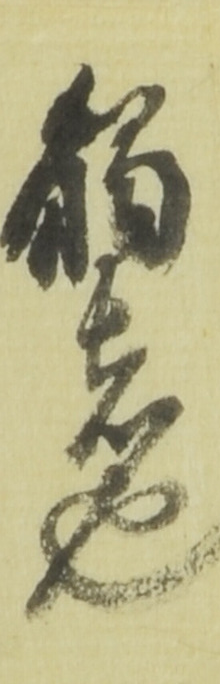触者也
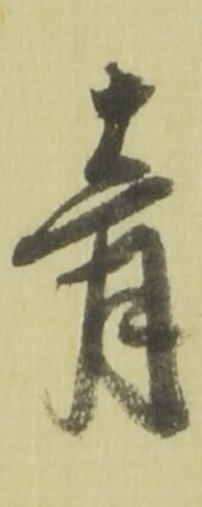十二月
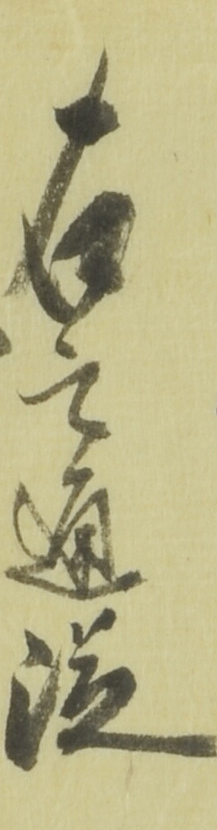右之通従
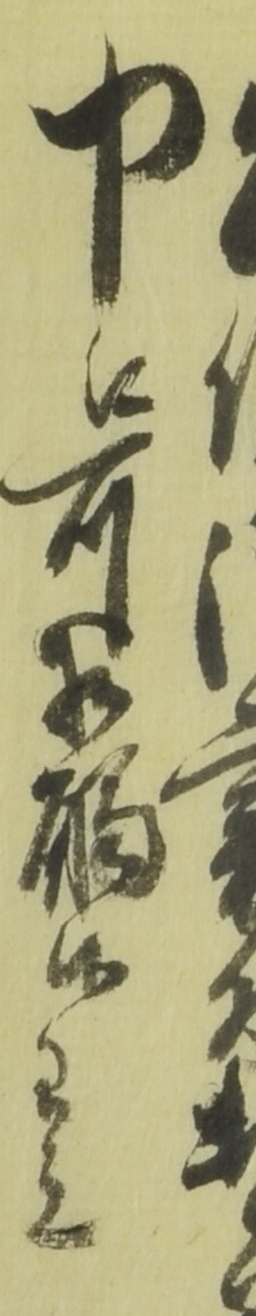中江可相触候已上
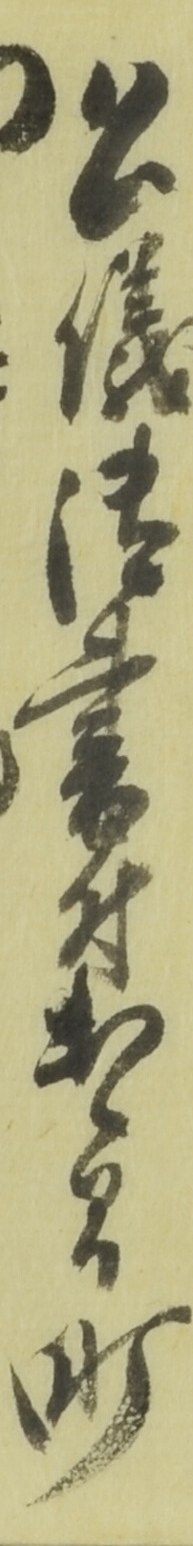公儀御書付出候間町

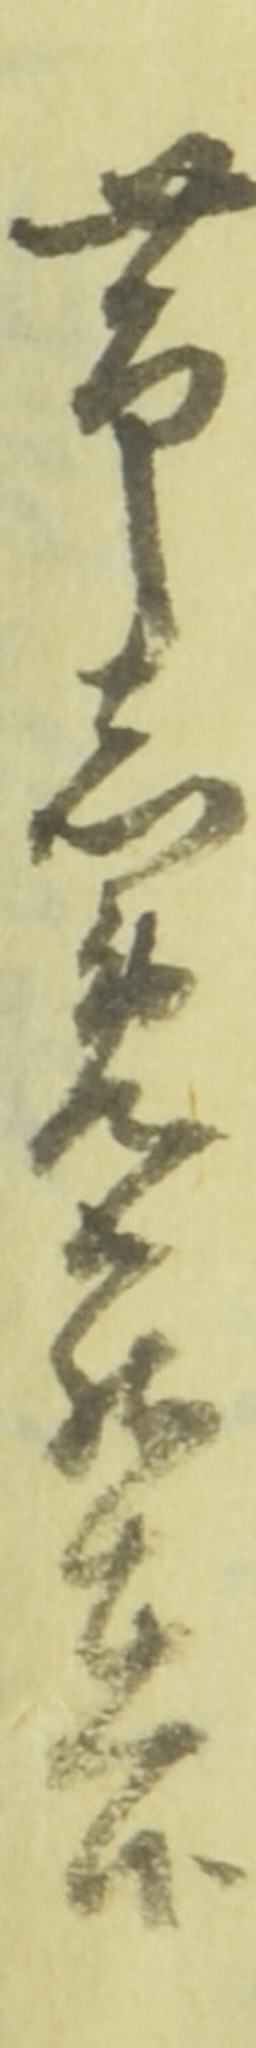帯しめ候被在候
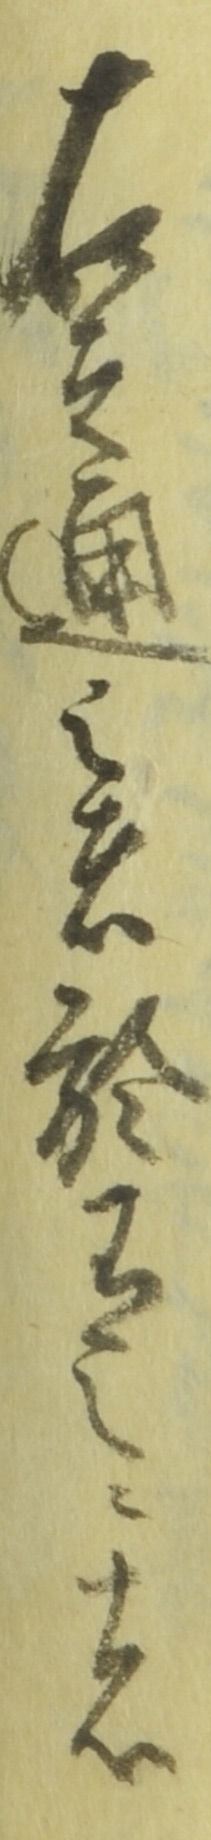右之通之者於有之ニは
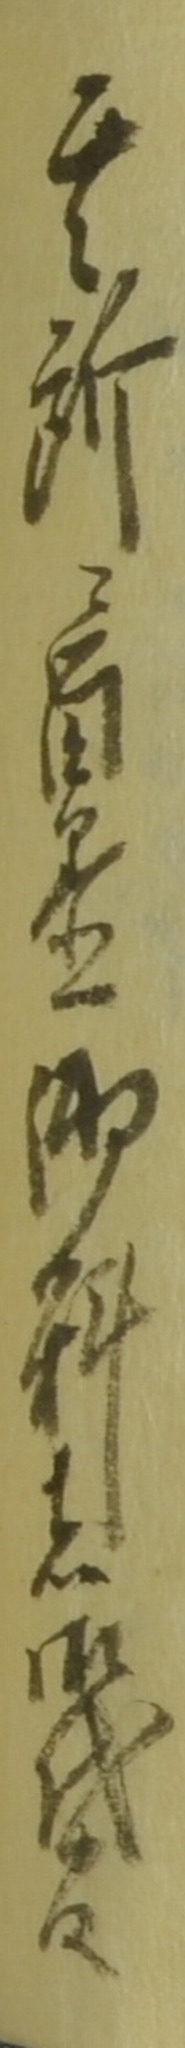其所ニ留置御料は御代官
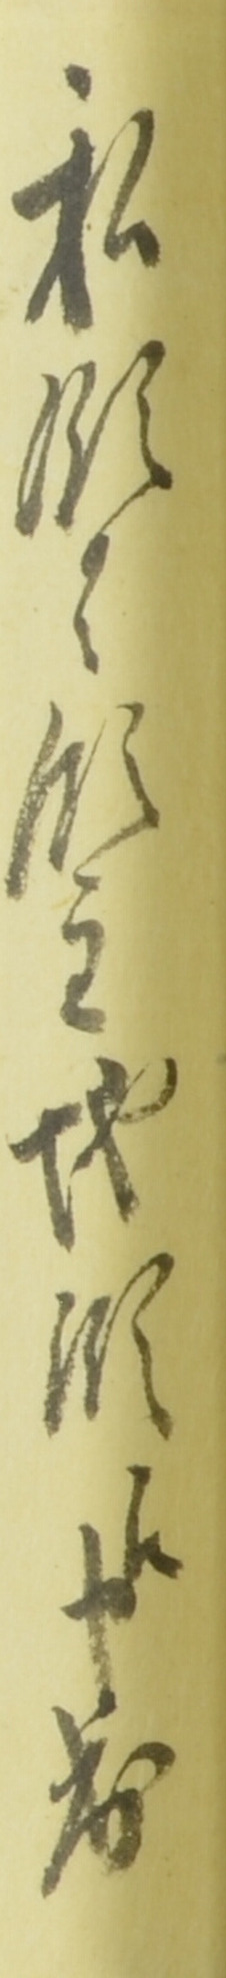私領は領主地頭江申出
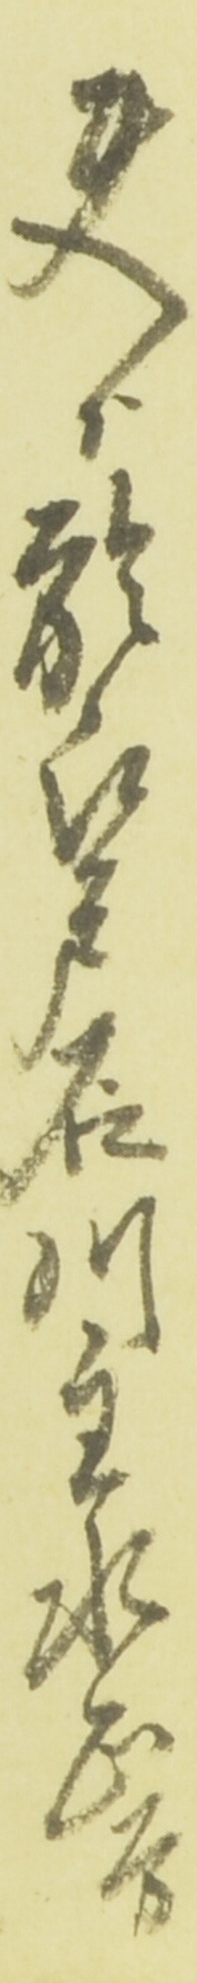夫ゟ於江戸石川主水正方
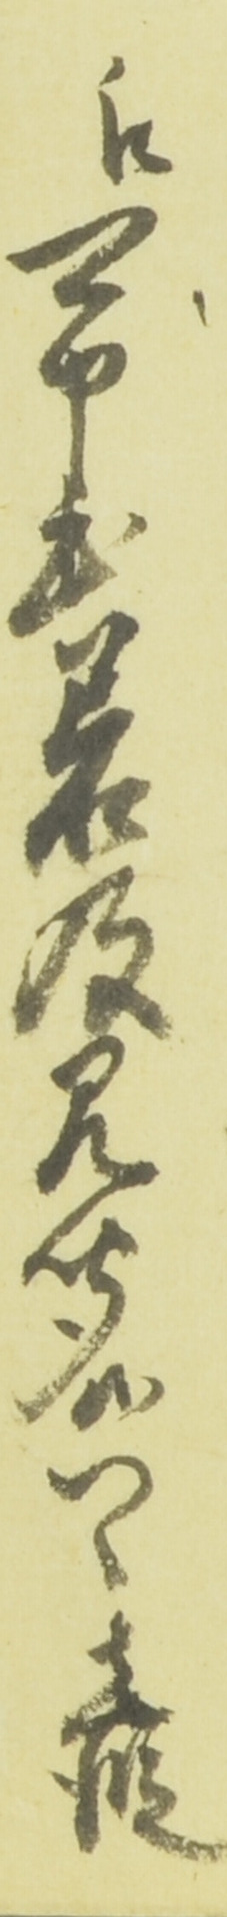江可申出若及見聞候ハヽ直段
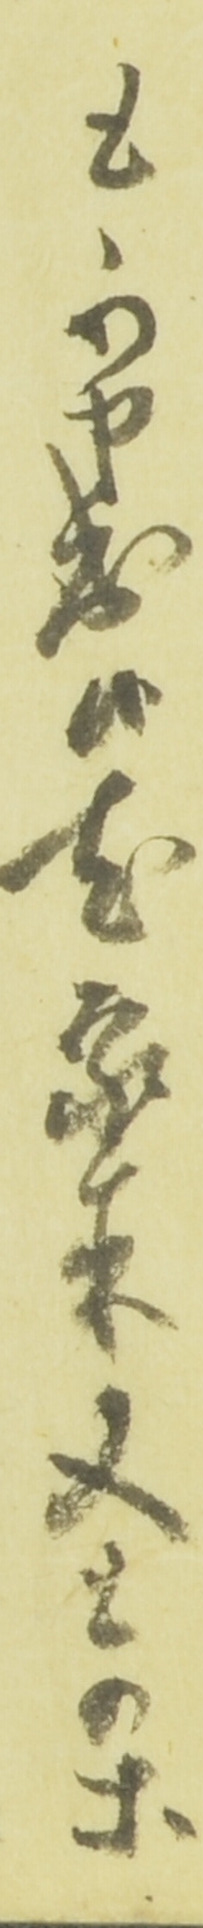も可申出候尤家来又もの等
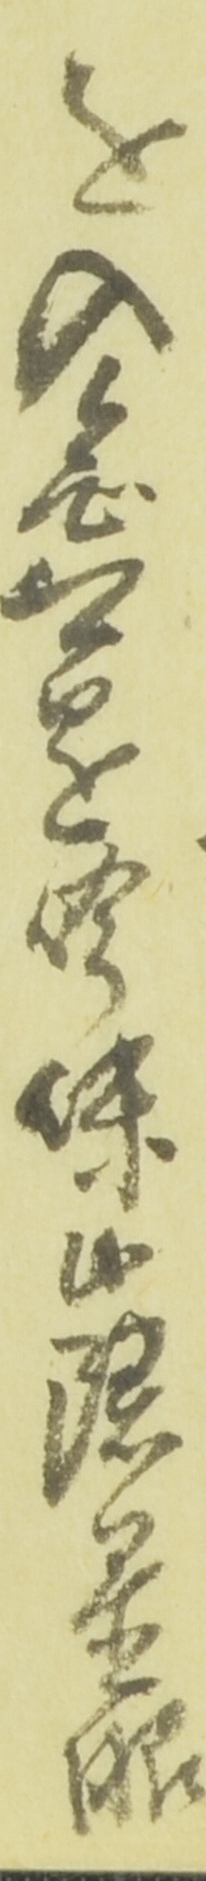を入念心懸吟味候隠置服
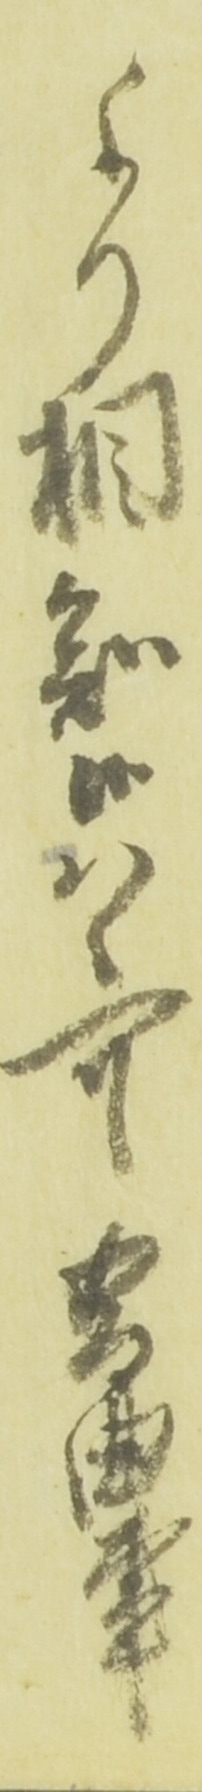より相知候ハヽ可有曲事
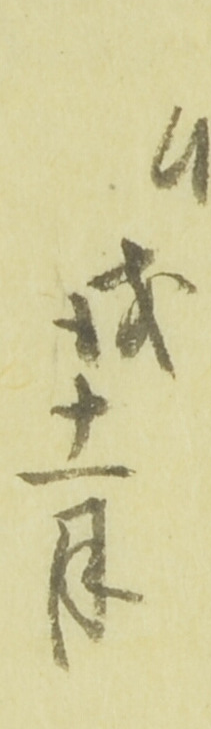戌十一月
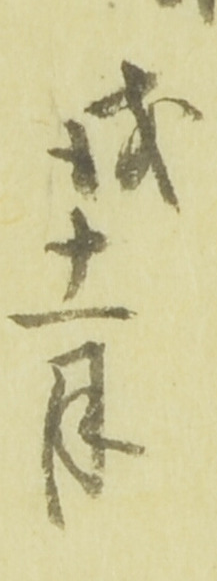戌十一月
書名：御触書御書附控
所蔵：伊那市立高遠町図書館・合同会社AMANE
